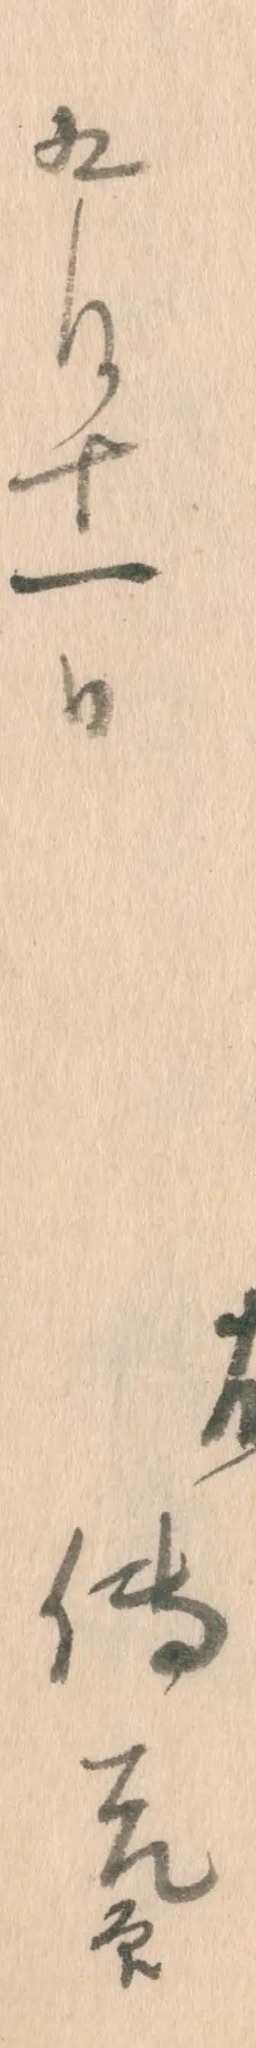九月十一日伝吉印

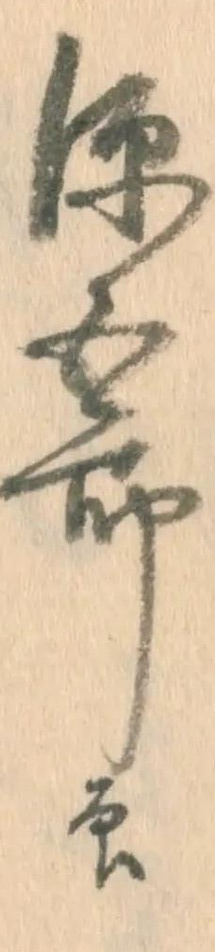源五郎印
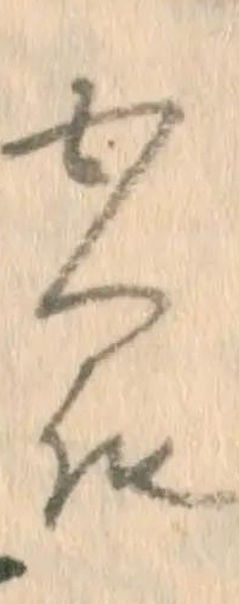五人組
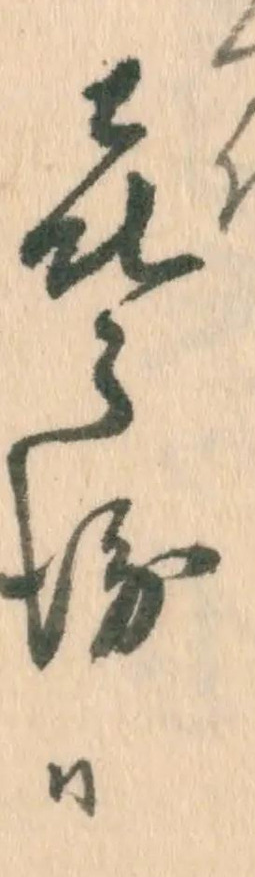喜兵衛同
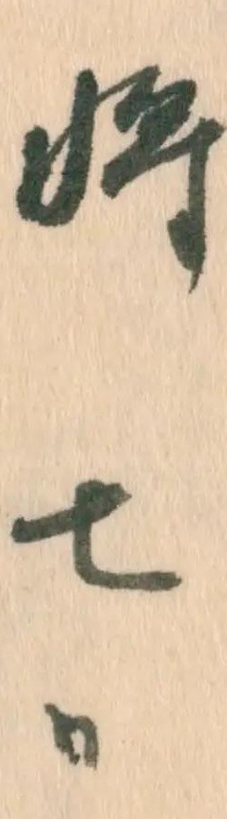将七同
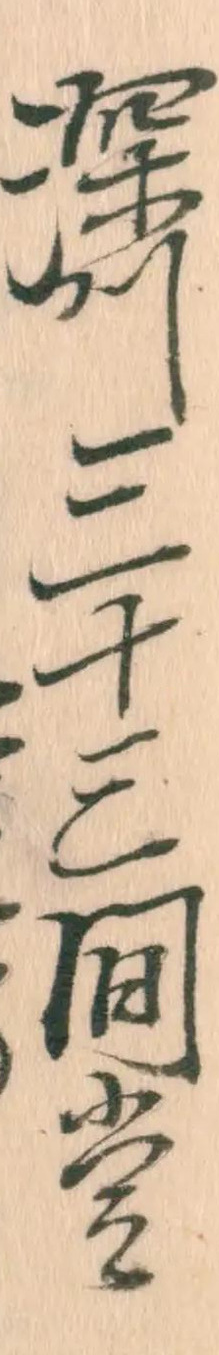深川三十三間堂
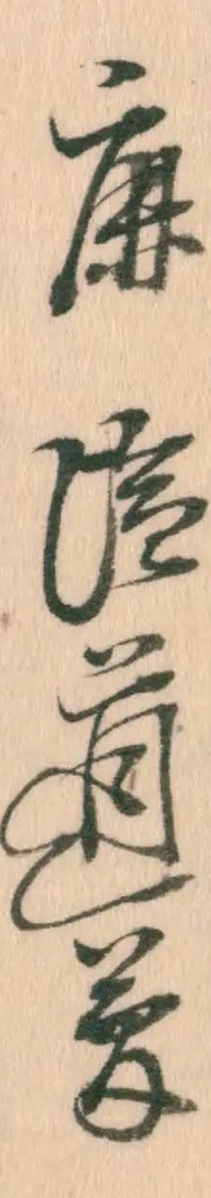鹿塩道菅
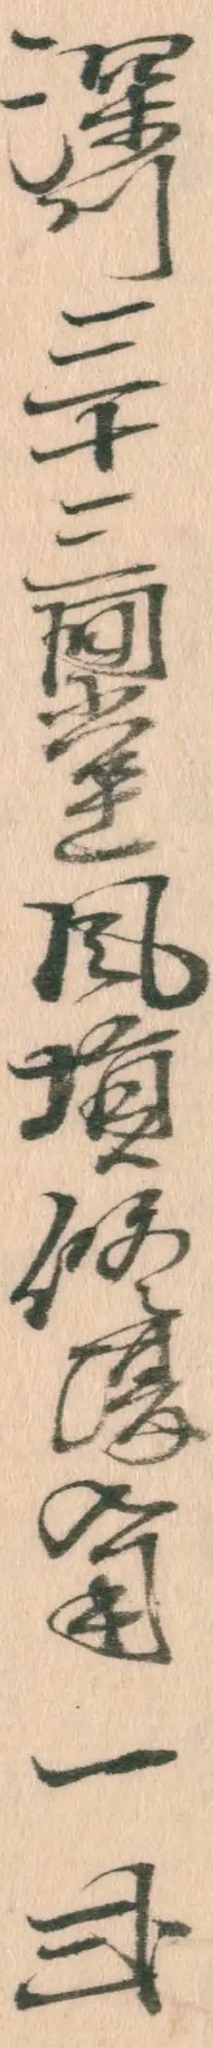深川三十三間堂風損修復入用一式
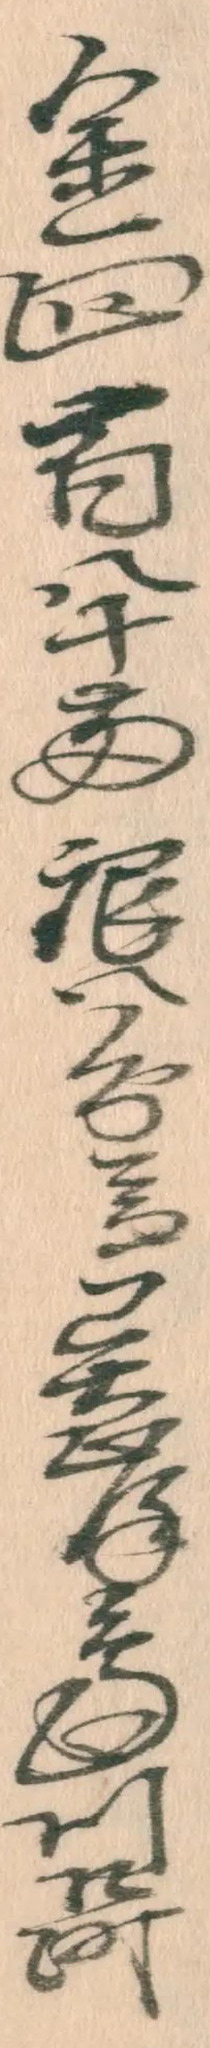金四百八十両銀八分為霊岸島川口町
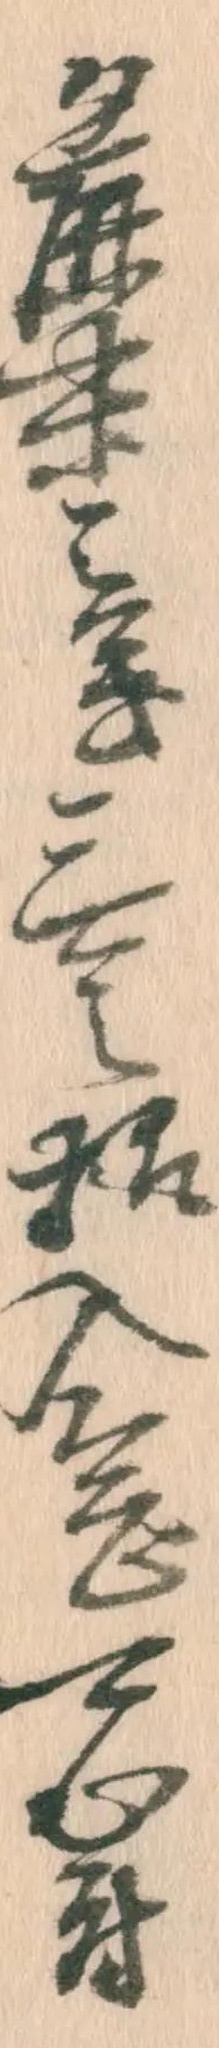麁末之義無之様入念可心付
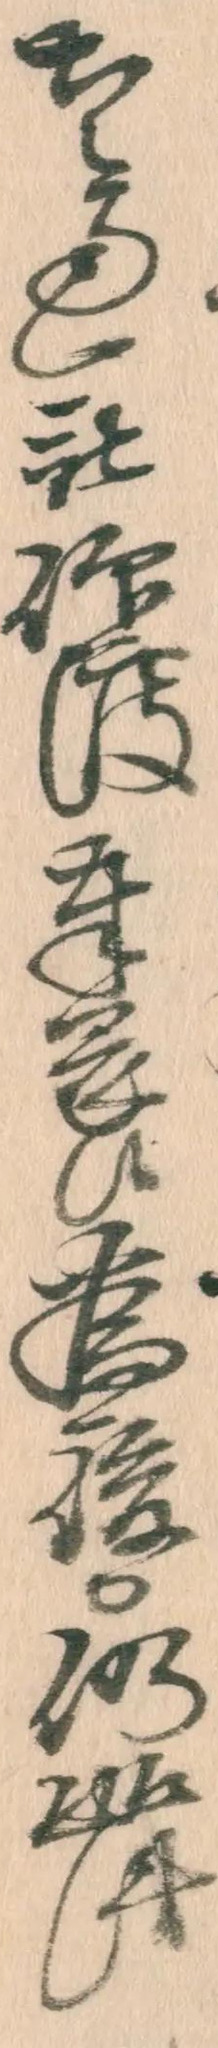右之通被仰渡奉畏候為後日仍如件

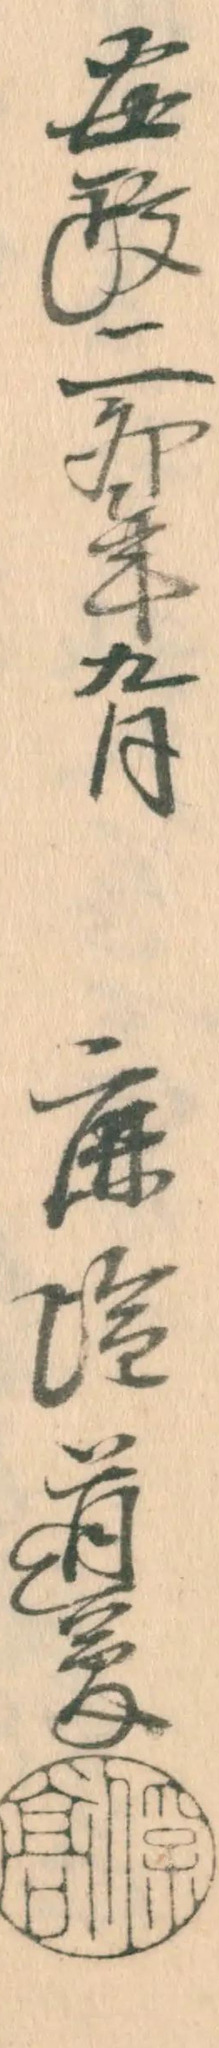安政二卯年九月鹿塩道菅(印)
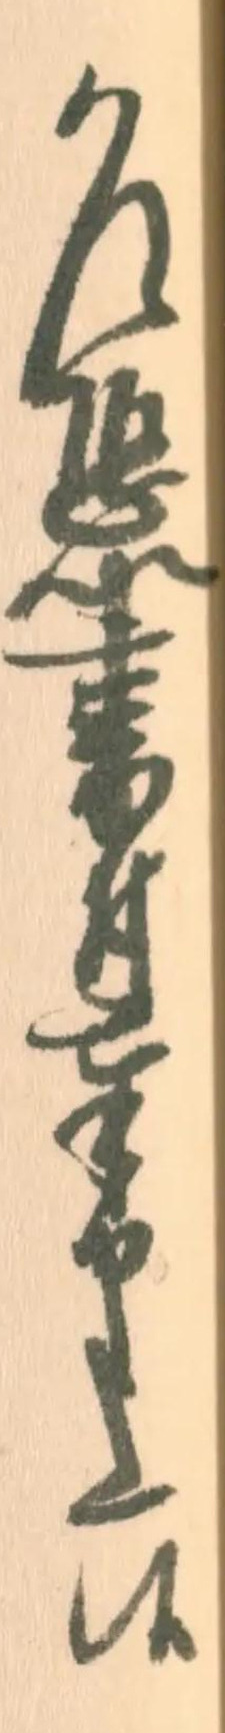乍恐以書付奉申上候
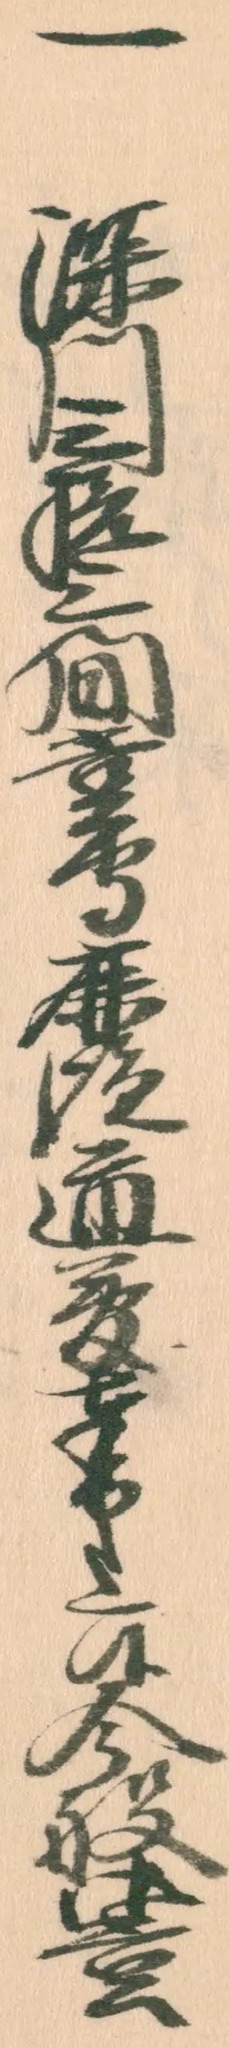一深川三拾三間堂守鹿塩道菅奉申上候今般御堂
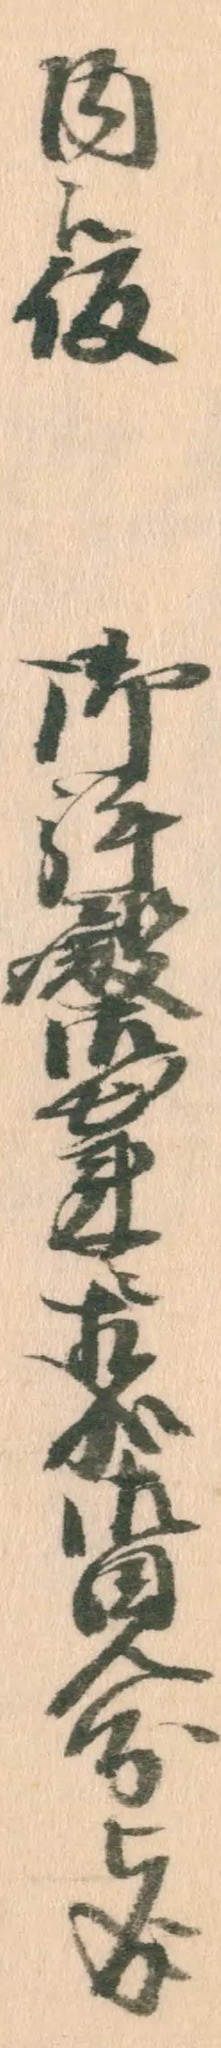内え仮御拝殿御出来に相成御見分被成
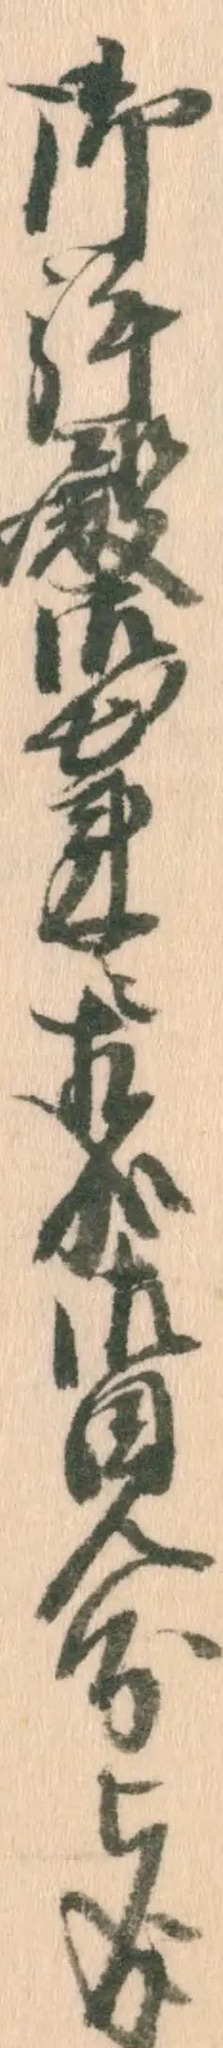内え仮御拝殿御出来に相成御見分被成
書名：三十三間堂. [1]
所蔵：国立国会図書館 National Diet Library, JAPAN
